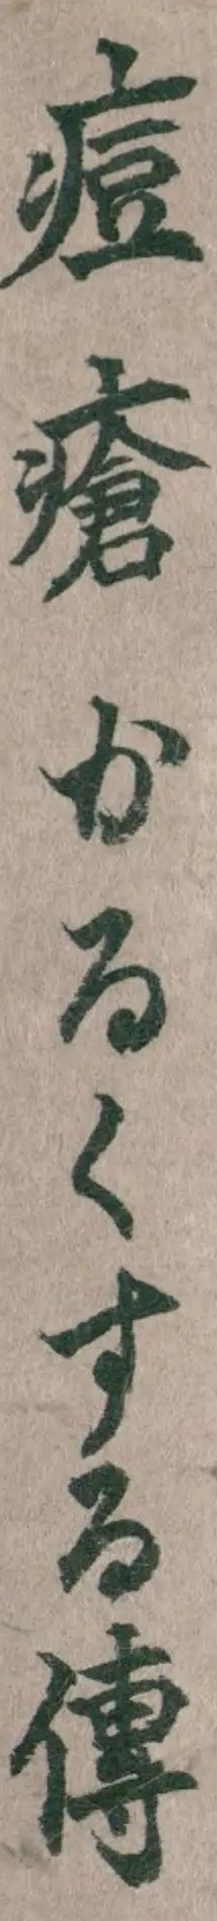痘瘡かるくする伝

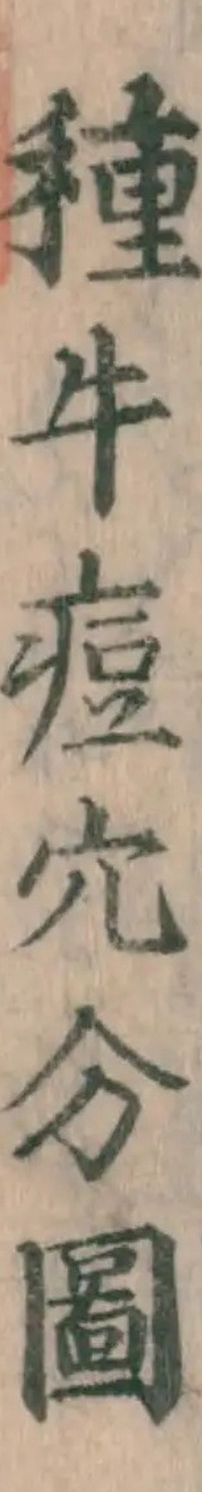種牛痘穴分圖
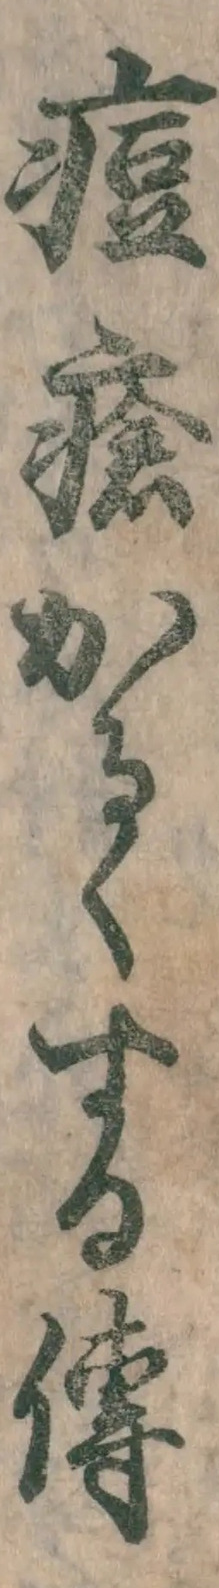痘瘡かるくする傳

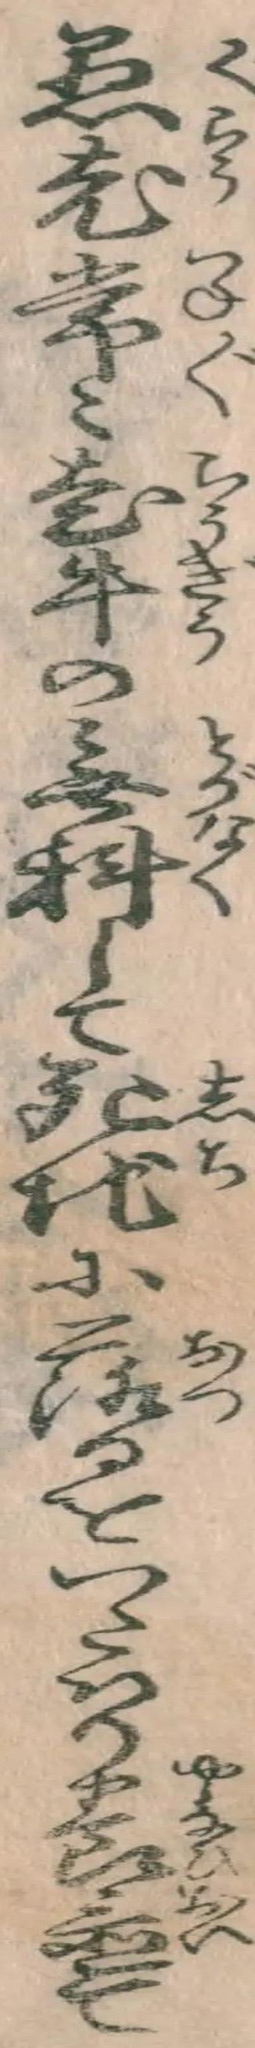愚老常々老牛の無科して死地に落るをいたはり養置て
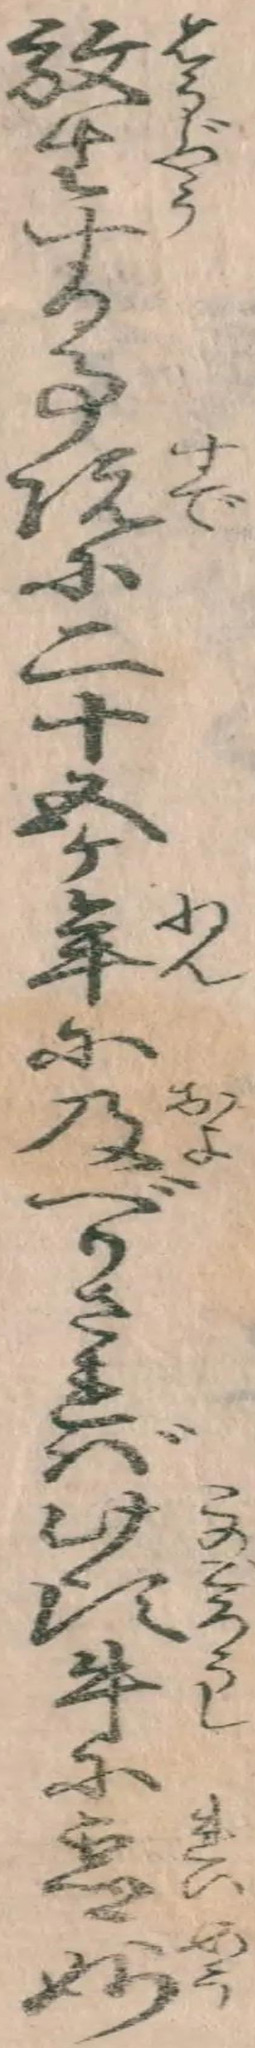放生する事既に二十五ヶ年に及べりされば此頃牛に霊妙
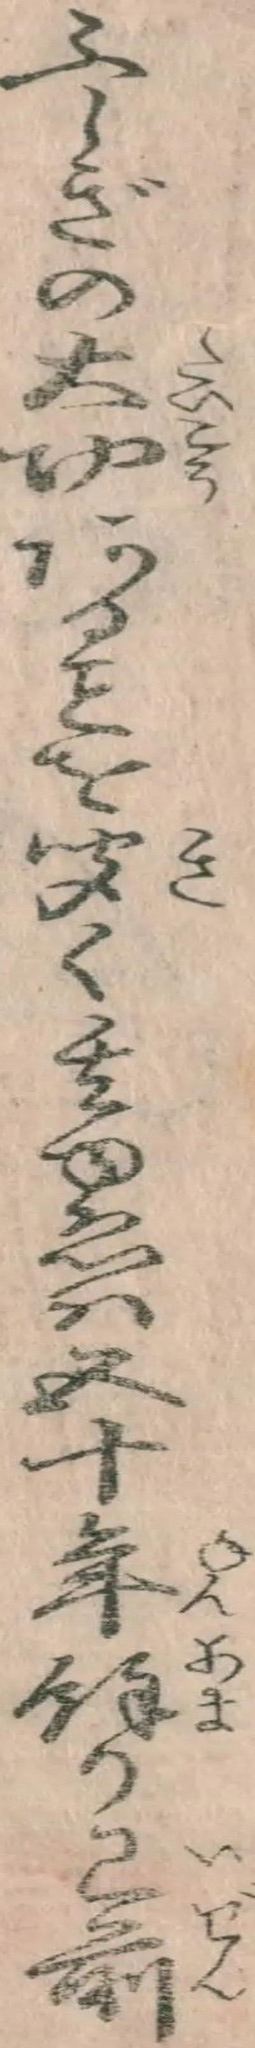ふしぎの大功あることを聞く其ゆゑは五十年余り已前
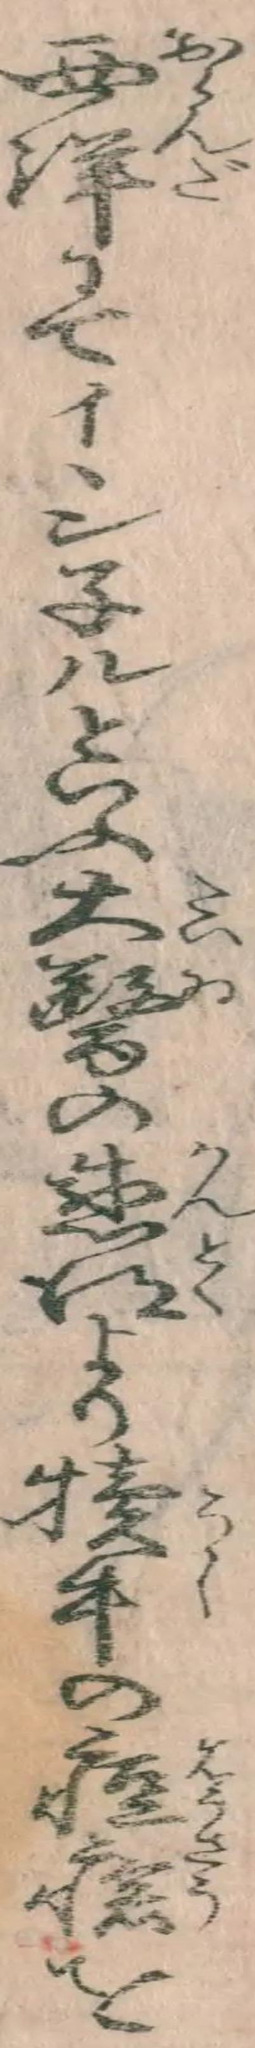西洋にてイヽンネルといふ大医の感得より犢牛の痘瘡を
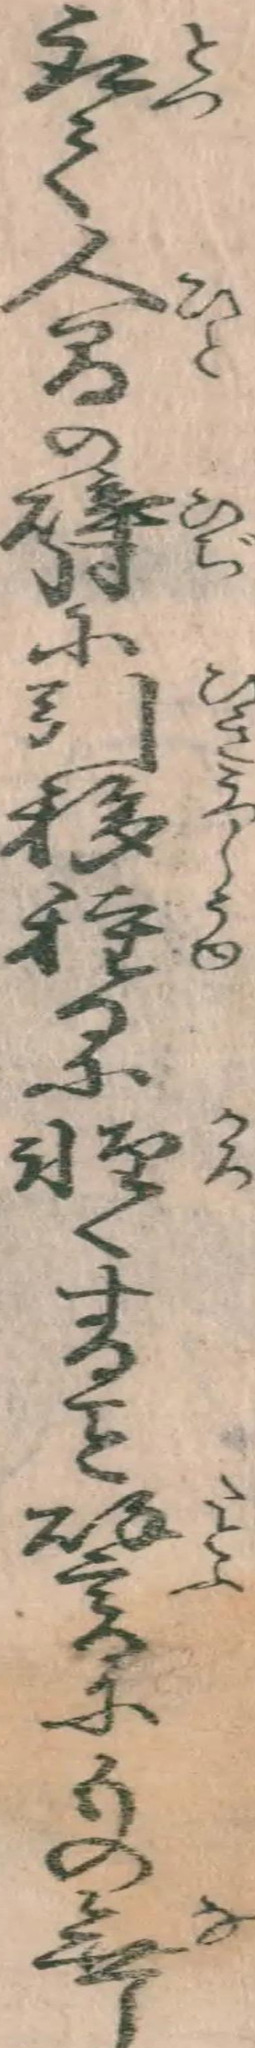取て人間の臂に引移種るに軽くすること譬るにもの無し
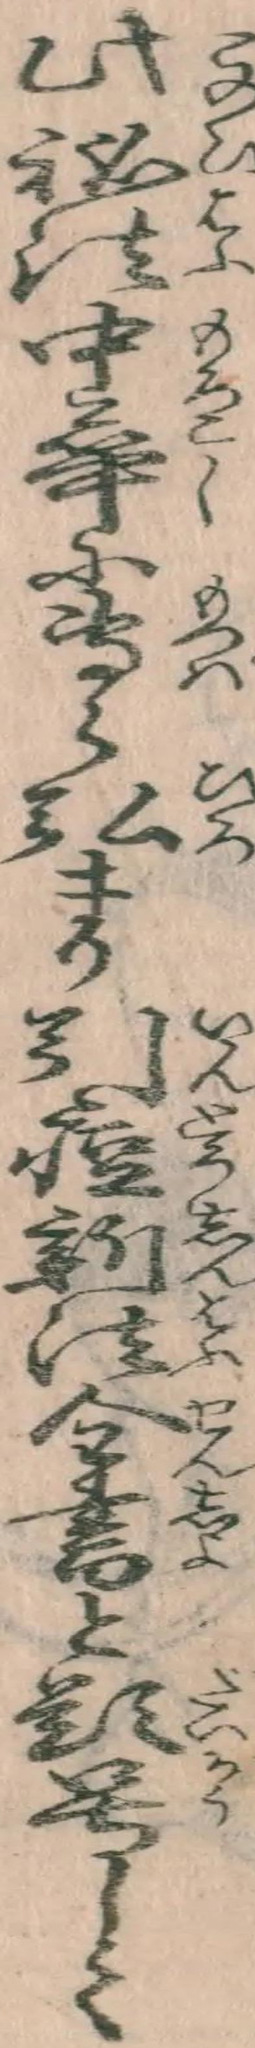此秘法中華に専ら弘まり引痘新法全書と題号して
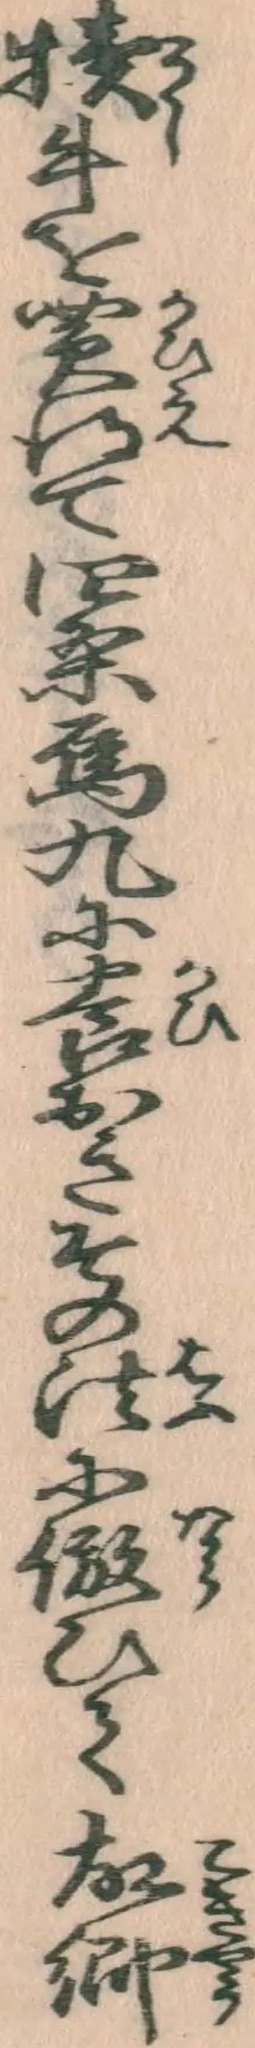犢牛を買得て四条烏丸に養おきその法に倣ひて故郷
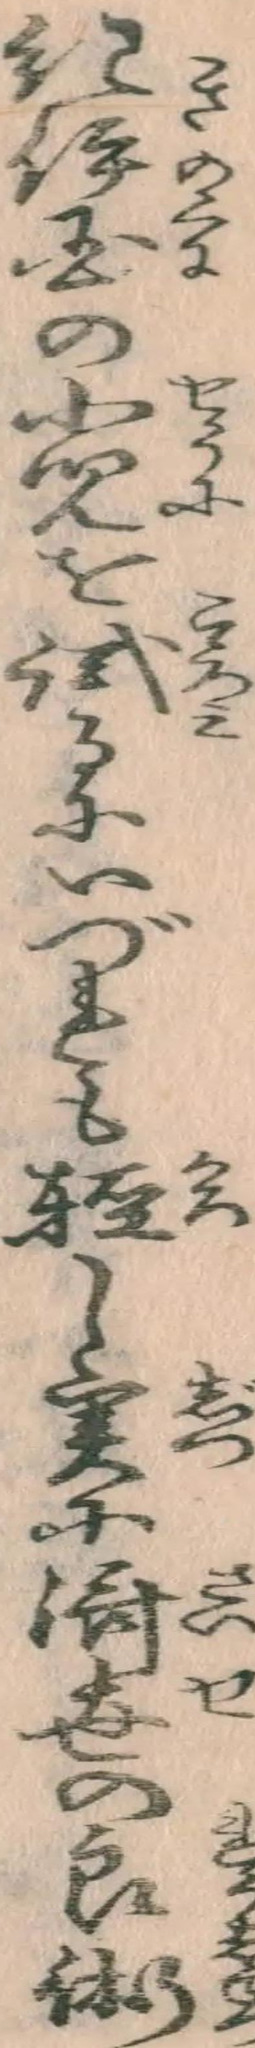紀伊国の小児を試るにいづれも軽し実に済世の良術
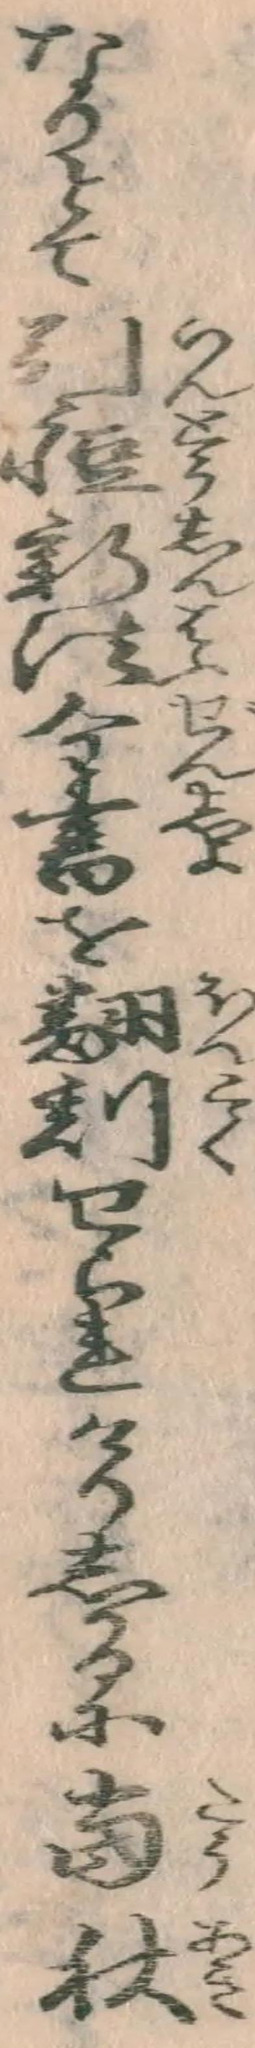なりとて引痘新法全書を翻刻せられけりしかるに当秋
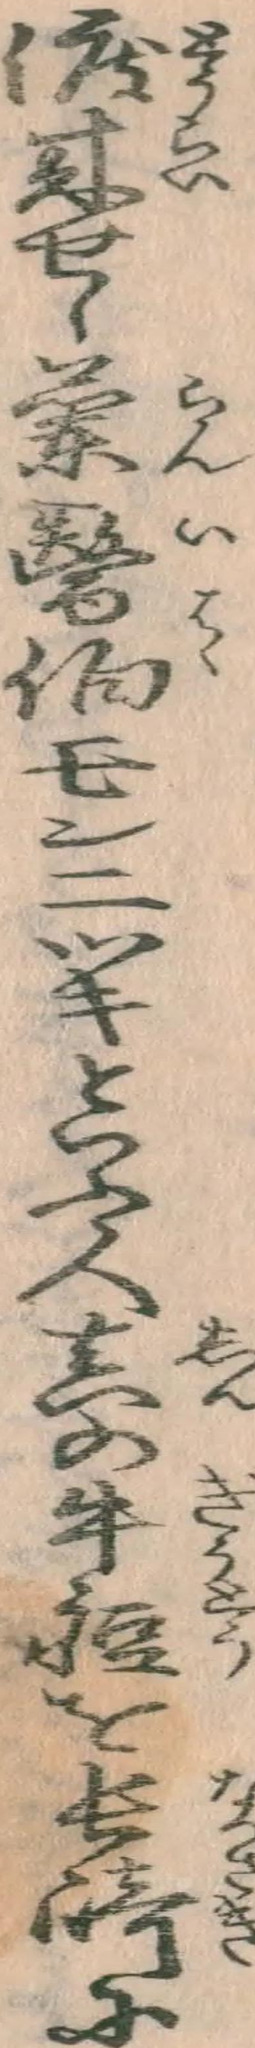渡来せし蘭医伯モンニツキといふ人真の牛痘を長崎に
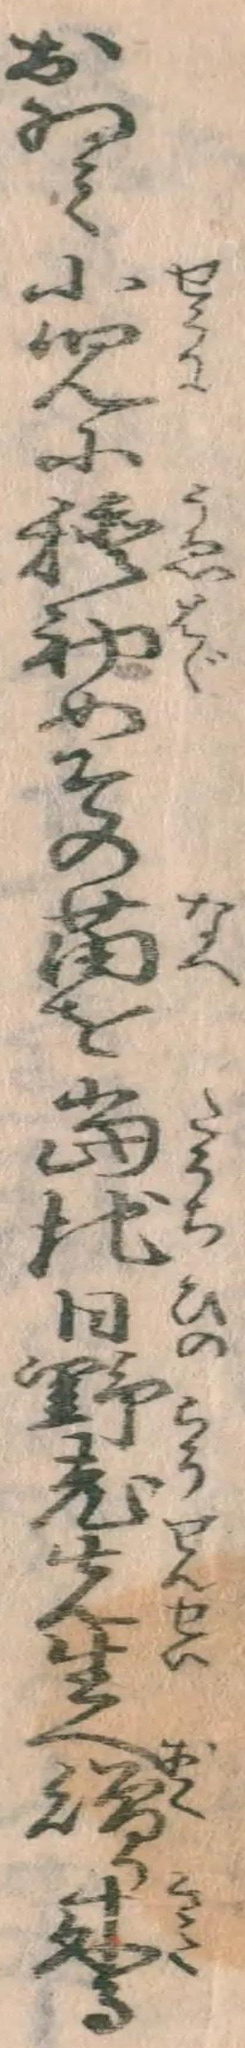おゐて小児に種初めその苗を当地日野老先生へ贈り来る
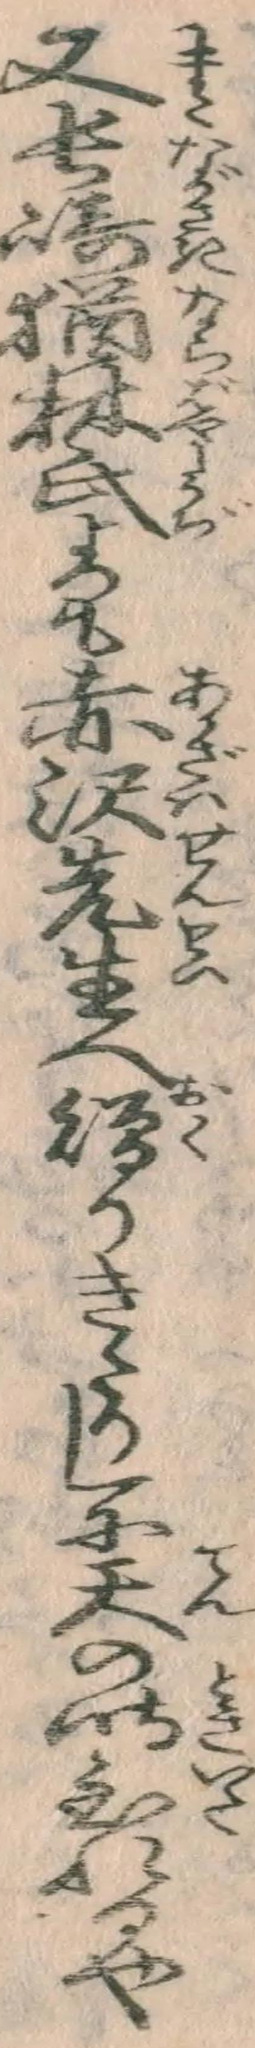又長崎楢林氏よりも赤沢先生へ贈りきたりしに天の時至れるや
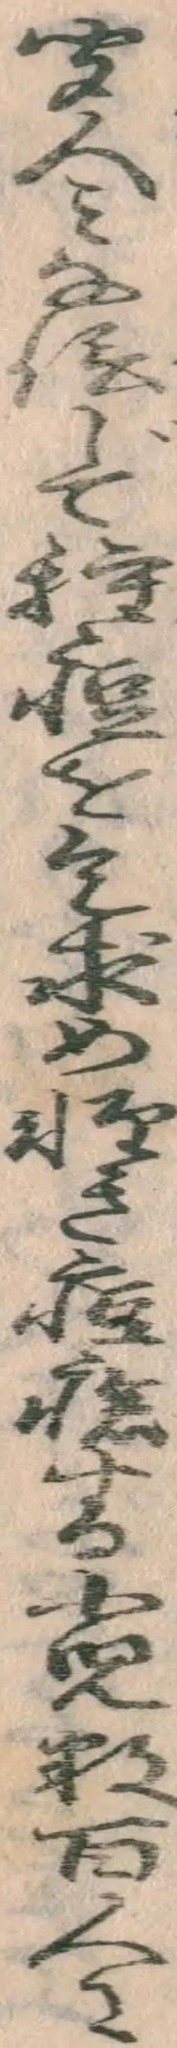聞人みな信じて種痘を乞求め軽き痘瘡する小児数百人に
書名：痘瘡かるくする傳
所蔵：国立国会図書館 National Diet Library, JAPAN
